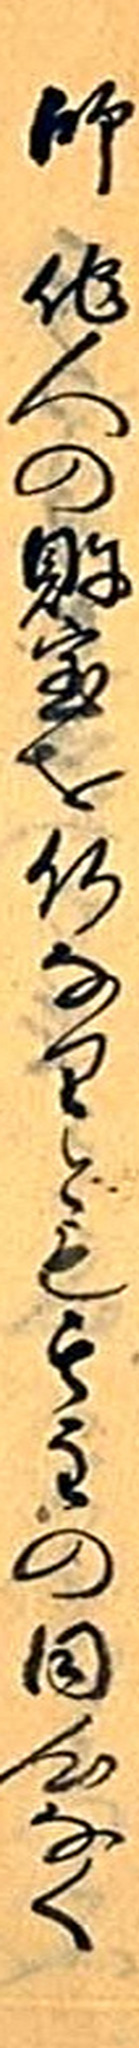師他人の財宝を何なりとも其主の同心なく
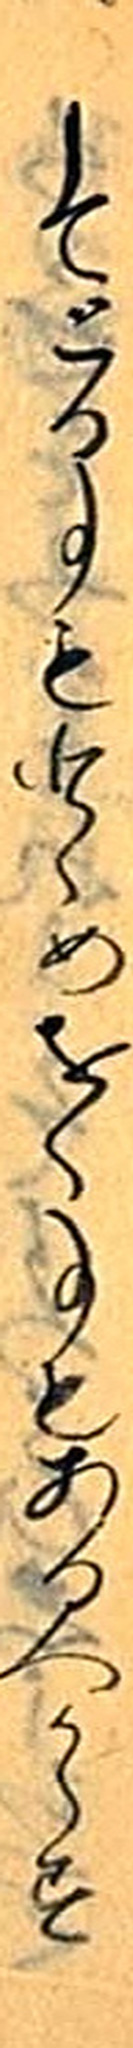してとる事もとゝめをくこと事もあるへからす
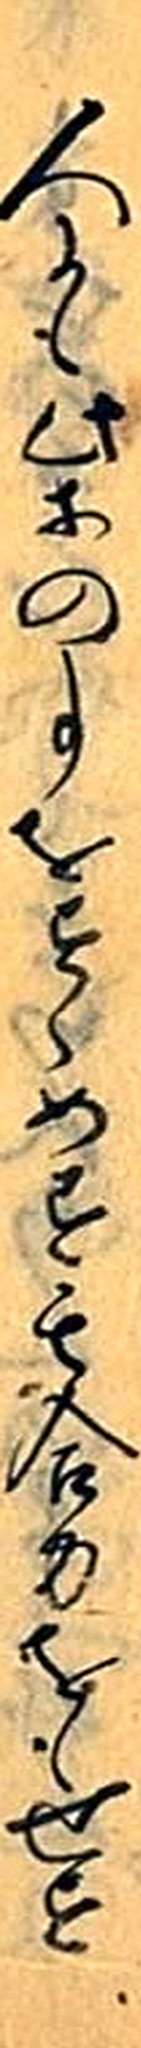人にも此等の事をすゝめす其合力をもせす
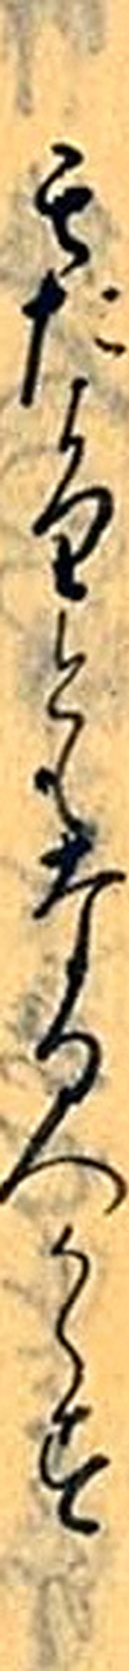其たよりともなるへからす
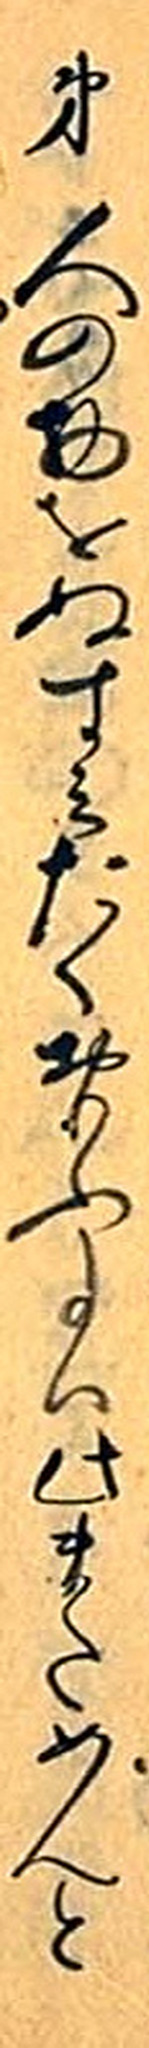弟人の物をぬすみたくおもふ事は此まためんと
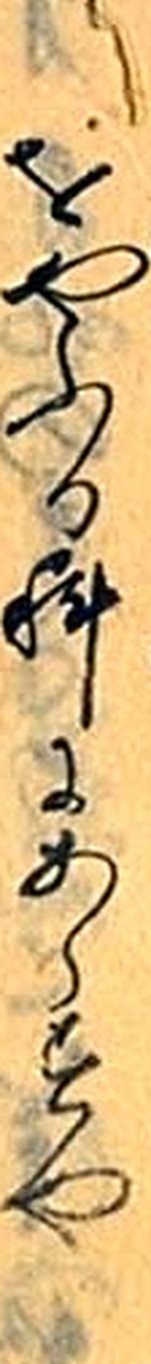をやふる科にあらすや
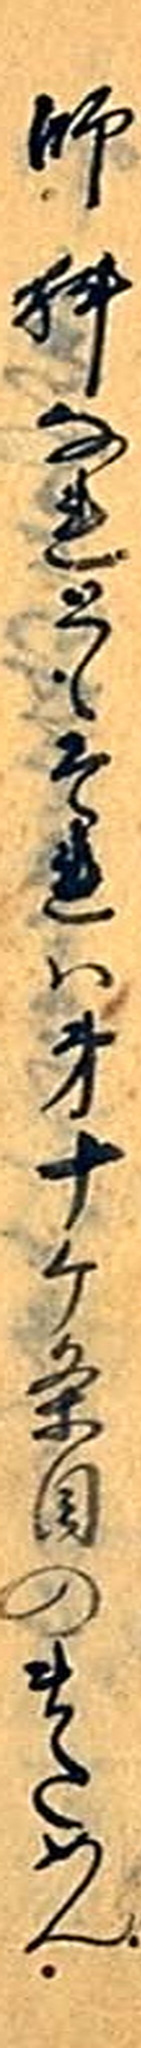師科なれともそれは第十ケ条目のまためん
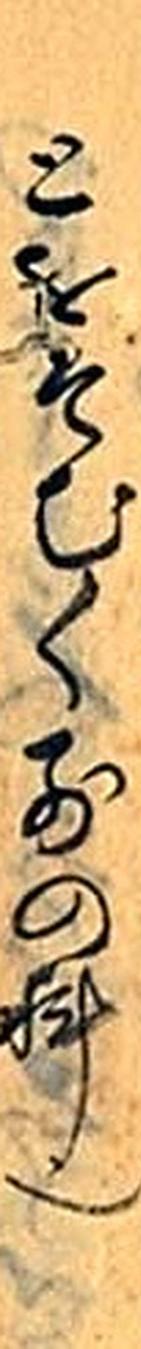とをそむく別の科也
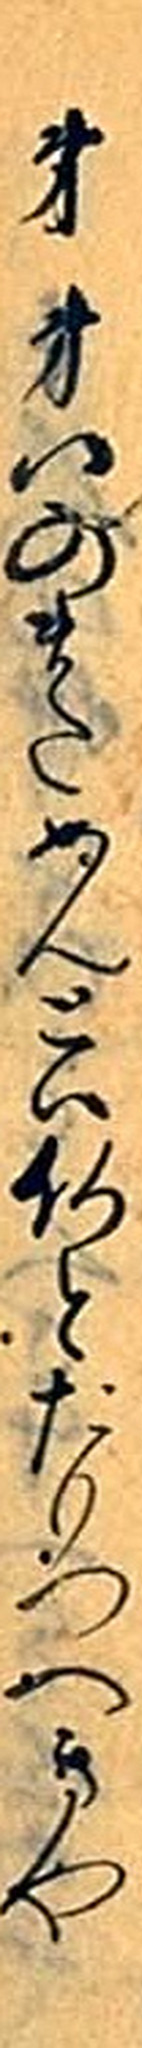弟第八のまためんとは何とたもつへきや
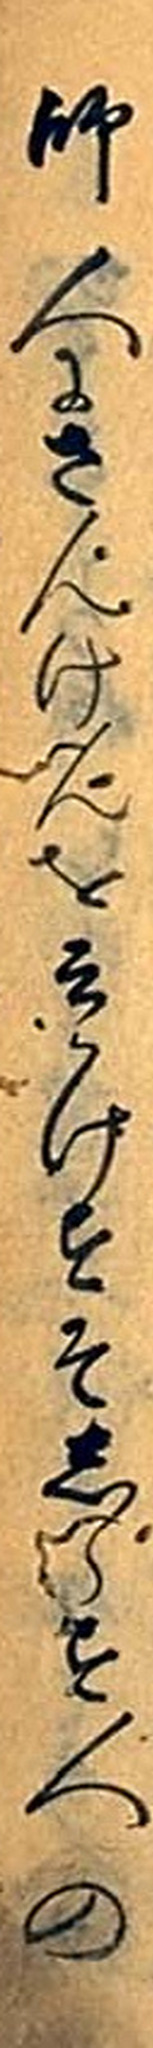師人にさんけんを云かけすそしらす人の

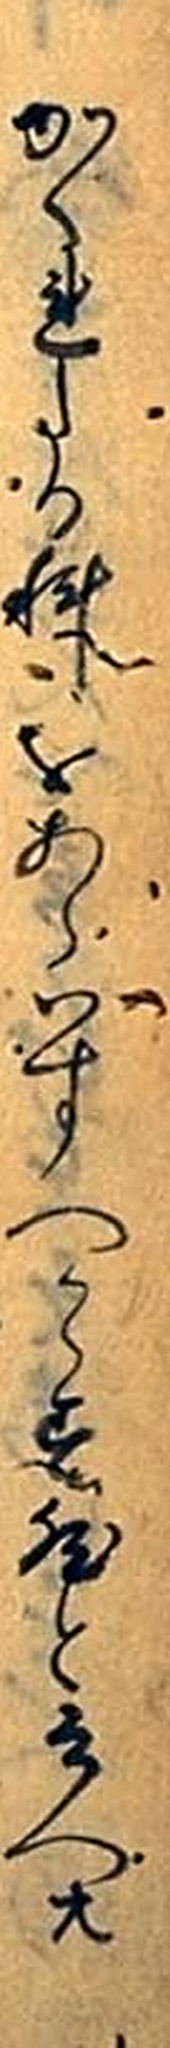かくれたる科をあらはすへからす然と云へ共
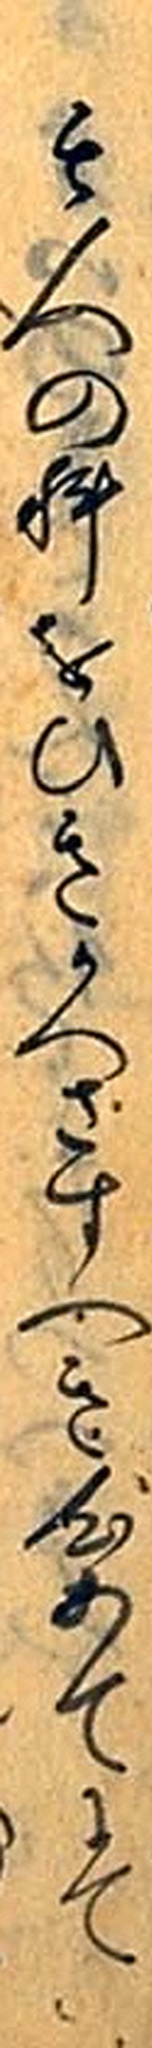其人の科をひきかへさすへき心あてにて
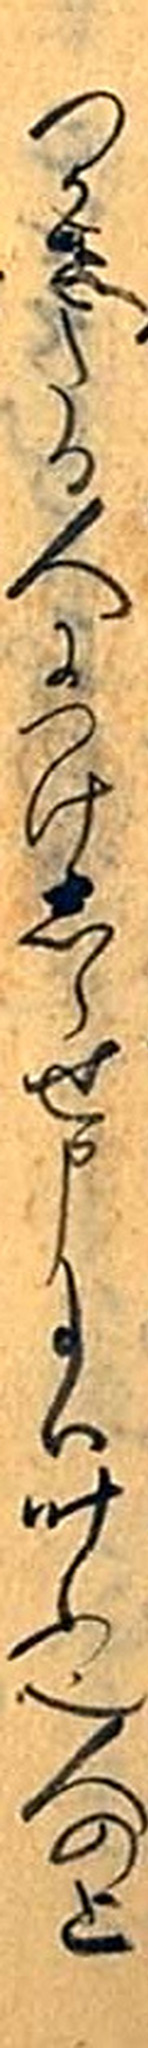つかさたる人につけしらせ申事は叶ふ也人の上
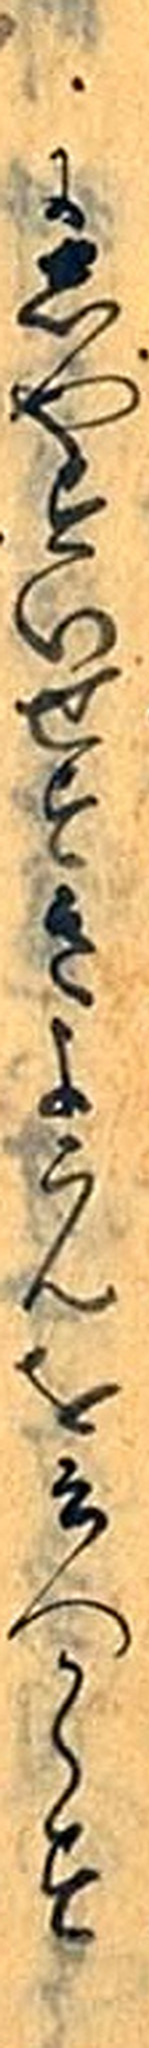にしやすいせすきよこんを云へからす
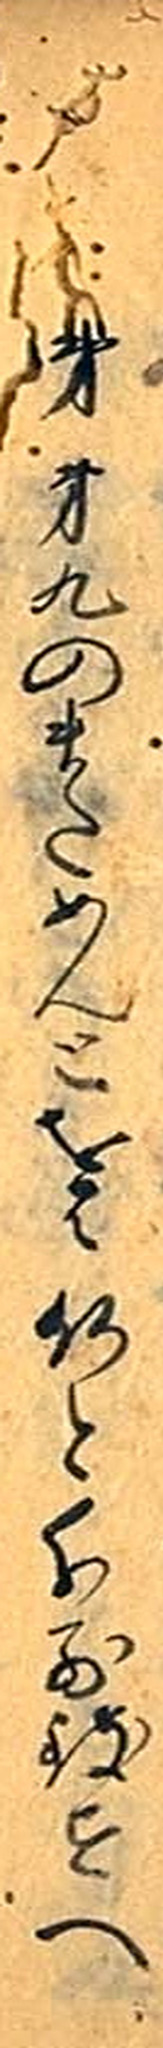弟第九のまためんとをは何と分別致すへ
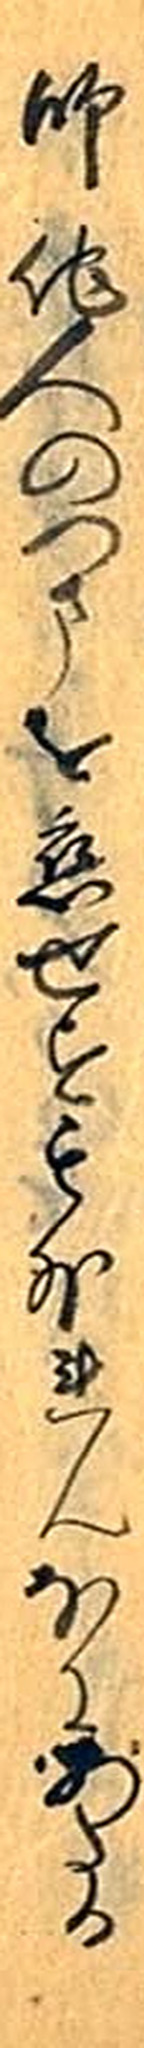師他人のつまを恋せす其外れんほにあたる
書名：ドチリナ・キリシタン
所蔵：東京大学総合図書館 / General Library in the University of Tokyo
